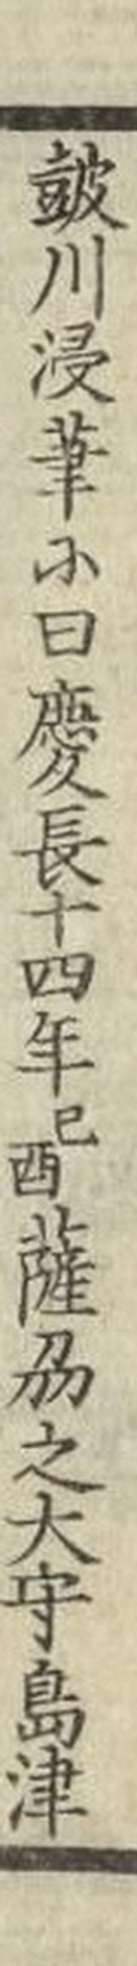皷川浸筆に曰慶長十四年己酉薩州之大守島津
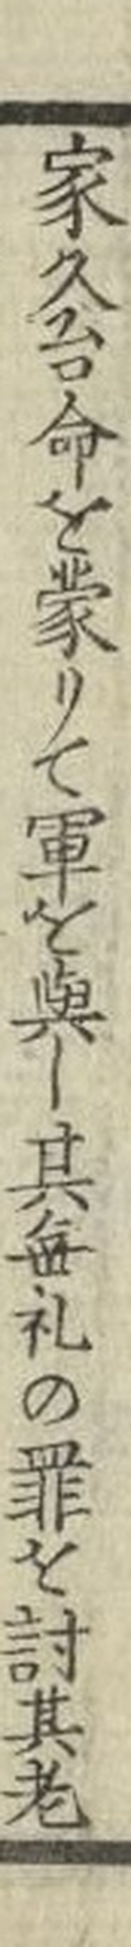家久台命を蒙りて軍を与し其無礼の罪を討其老
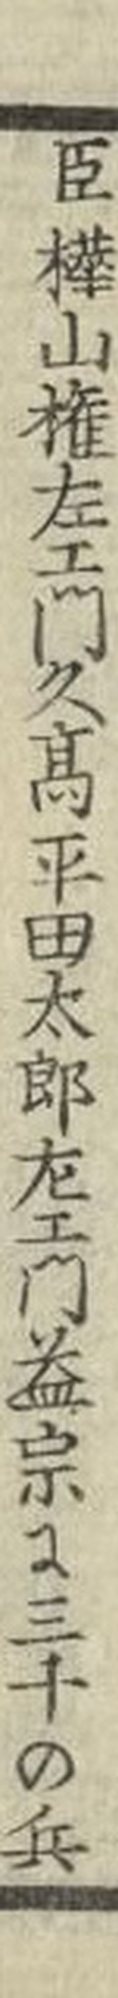臣樺山権左エ門久高平田太郎左エ門益宗に三千の兵
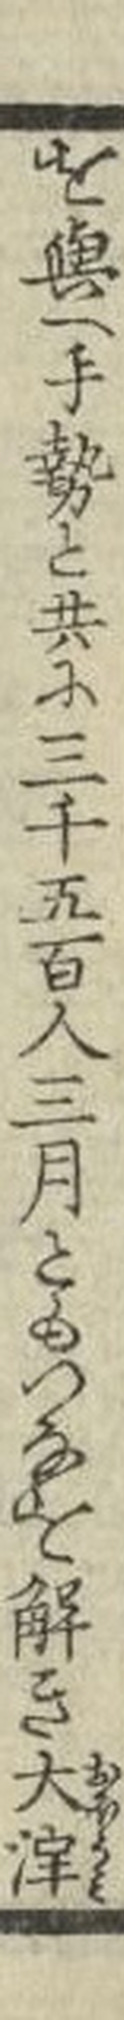を与へ手勢と共に三千五百人三月ともつなを解き大洋
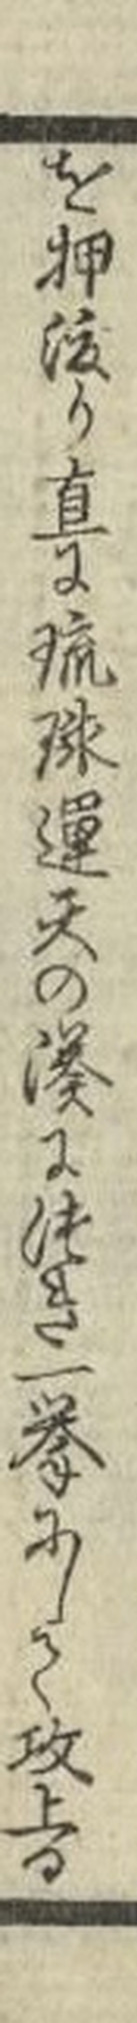を押渡り直に琉球運天の湊につき一挙にして攻上る
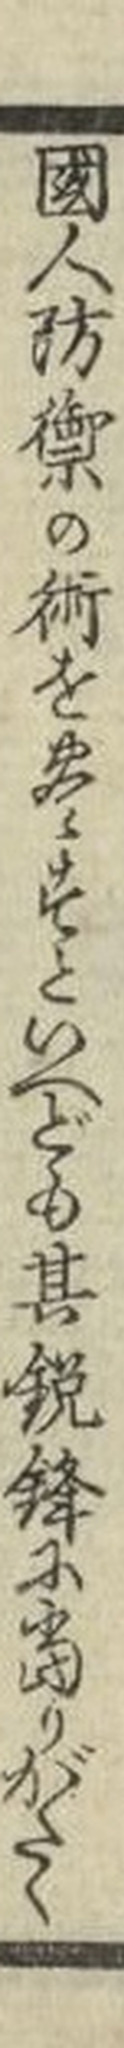国人防禦の術を尽すといへども其鋭鋒に当りがたく
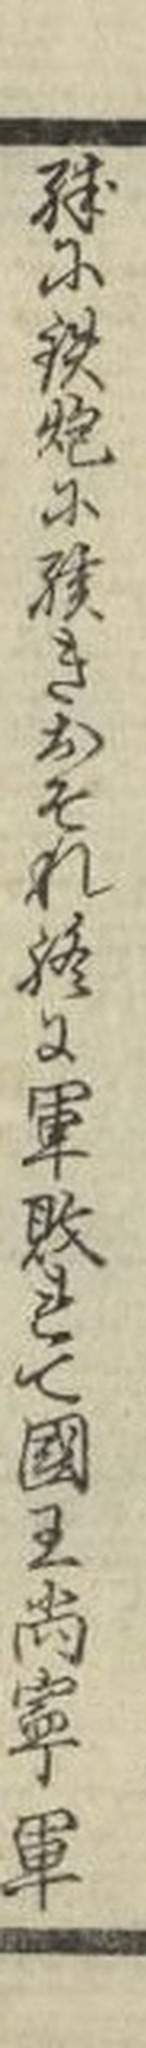殊に鉄炮に駭きおそれ終に軍敗れて国王尚寧軍
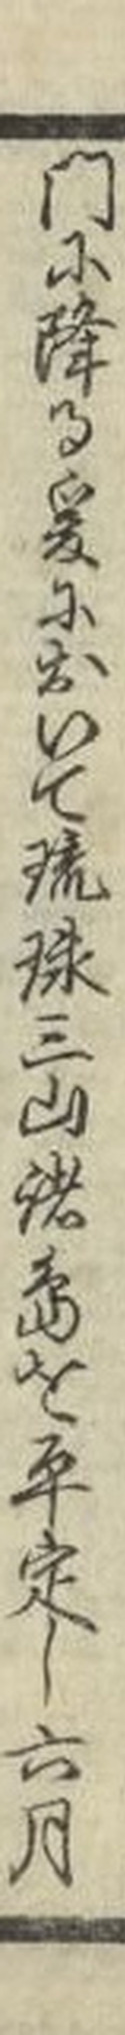門に降る爰において琉球三山諸島を平定し六月
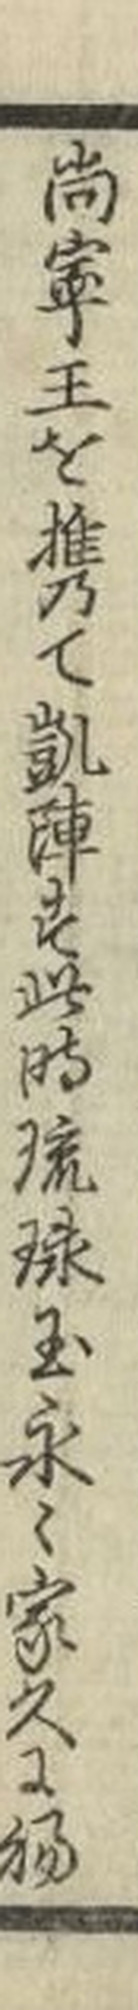尚寧王を携て凱陣す此時琉球国永々家久に賜
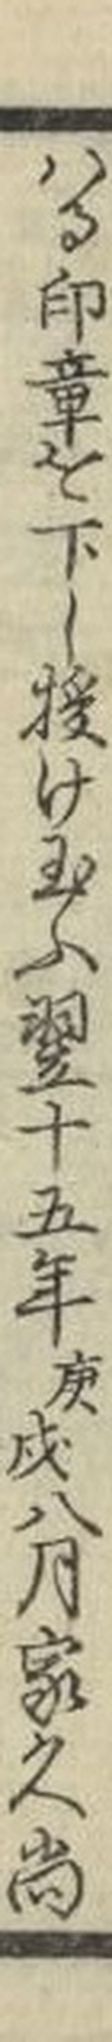はる印章を下し授け玉ふ翌十五年庚戌八月家久尚
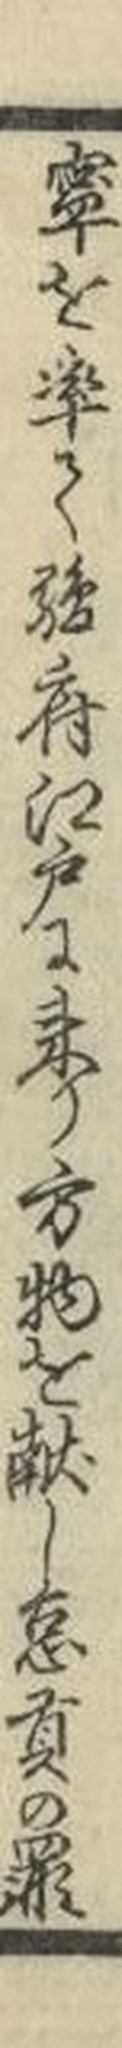寧を率て駿府江戸に来り方物を献し怠貢の罪
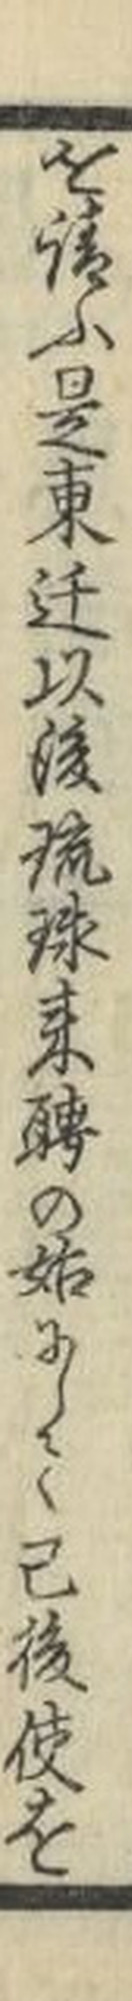を請ふ是東遷以後琉球来聘の始にして已後使を
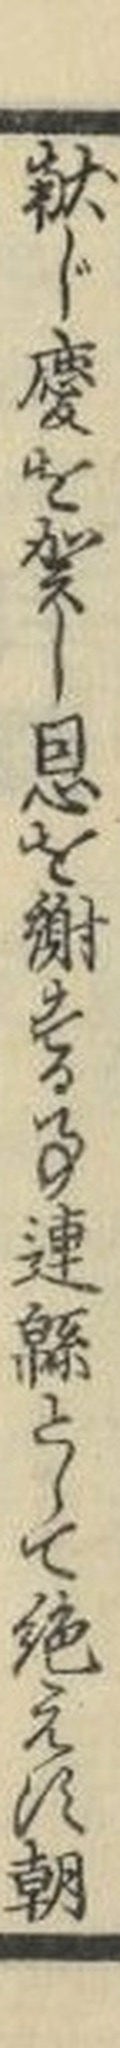献じ慶を賀し恩を謝する事連綿として絶えす朝
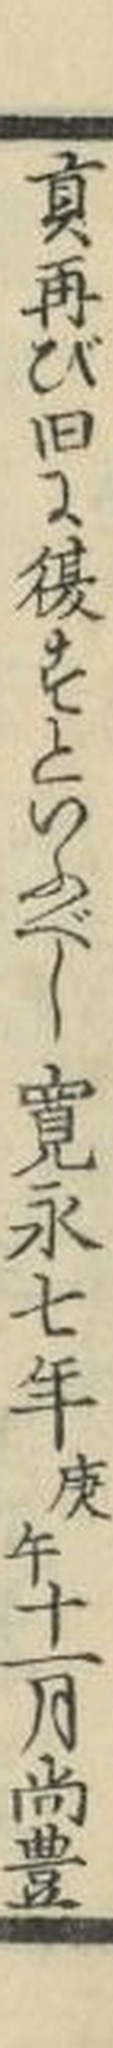貢再び旧に復すといふべし寛永七年庚午十一月尚豊
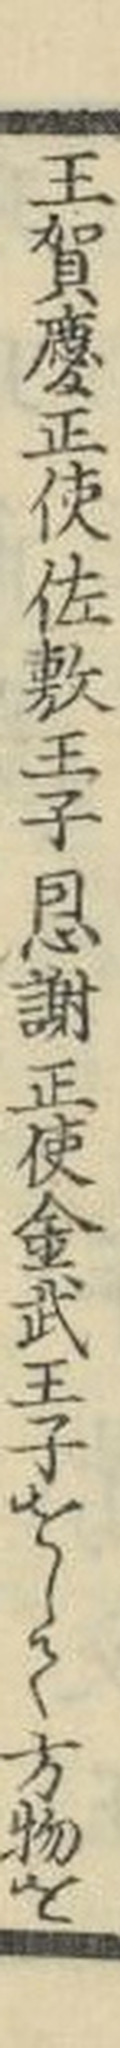王賀慶正使佐敷王子恩謝正使金武王子をして方物を
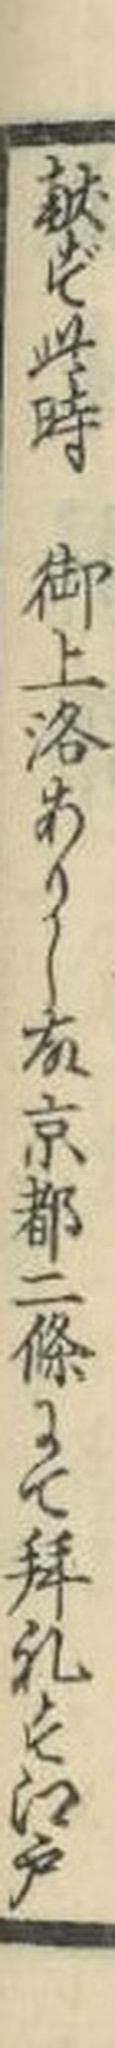献ず此時御上洛ありし故京都二条にて拝礼す江戸
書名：琉球解語
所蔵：University of the Ryukyus Library
